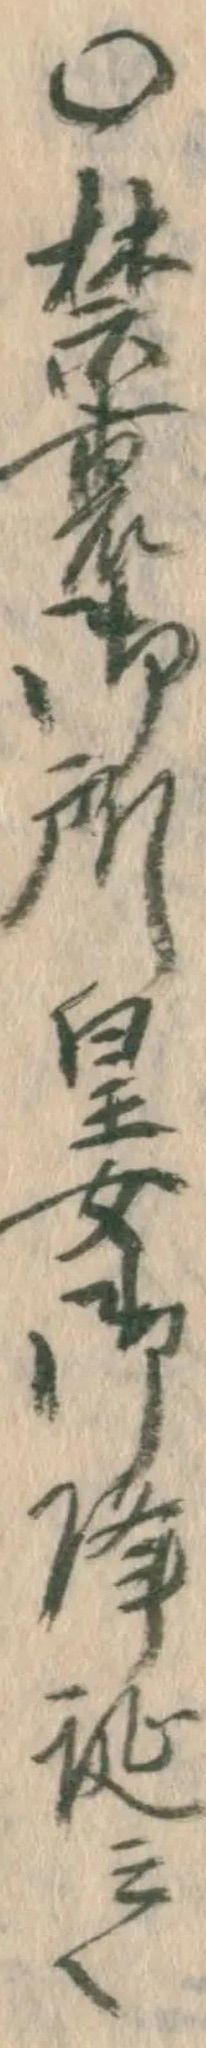○禁裏御所皇女御降誕云々
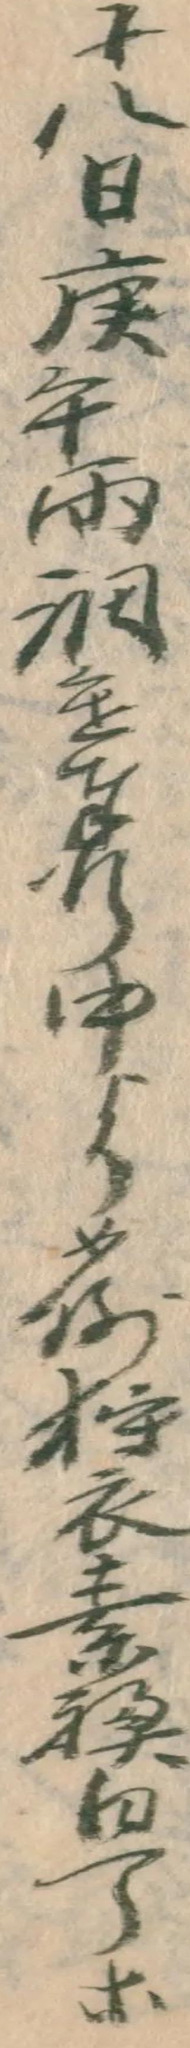十八日庚午雨調進奉行中より如例狩衣素襖白丁等
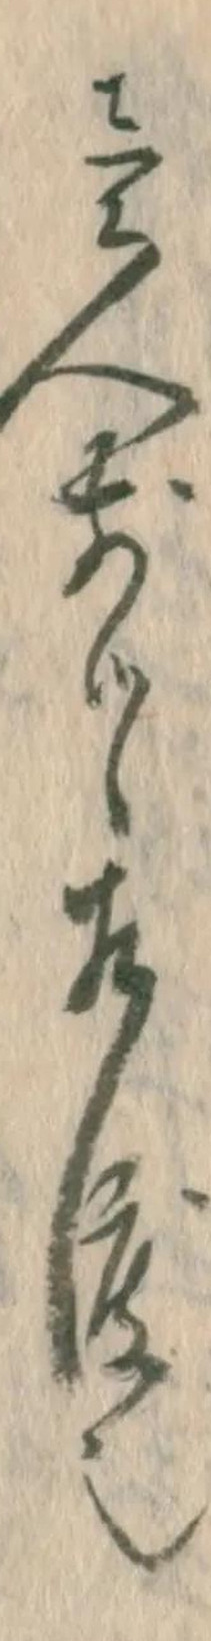壱人前ツヽ相渡也
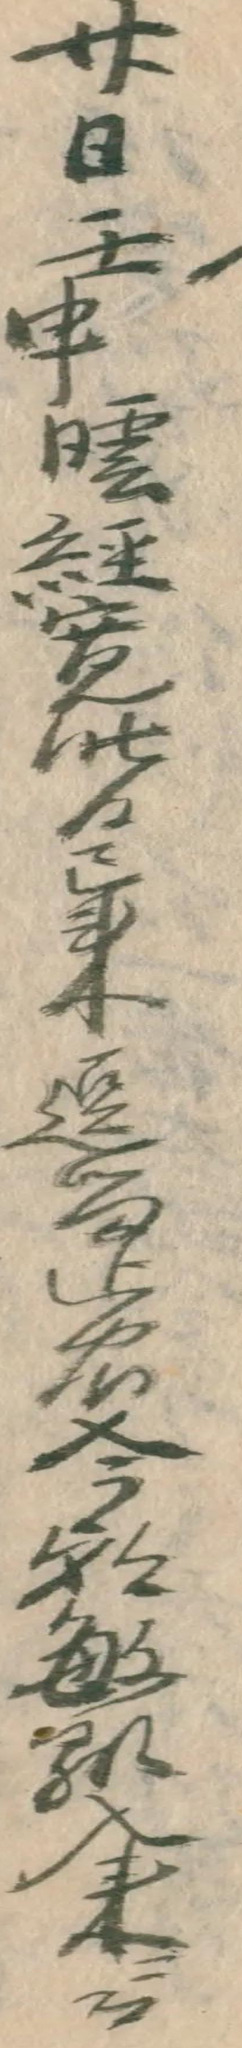廿日壬申曇経寛昨日已来逗留止宿今朝敏顕入来ニ而
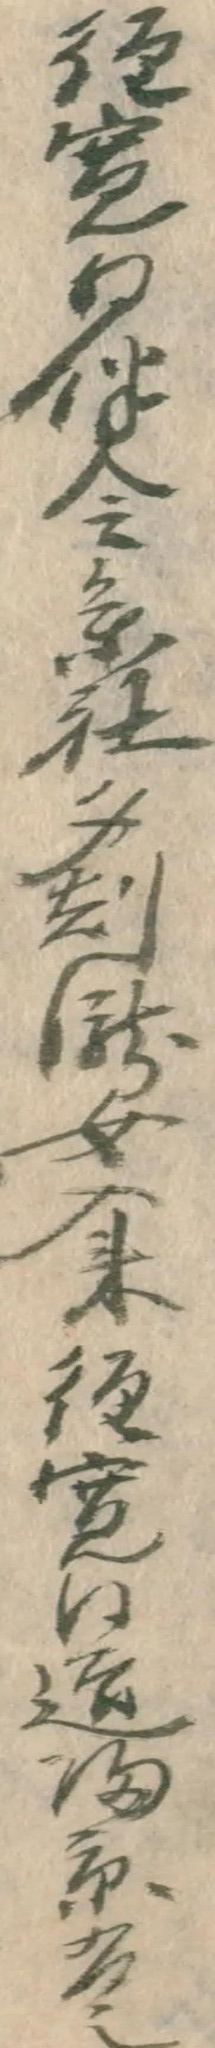経寛同伴令参社夕刻瀧女入来経寛同道帰京有之
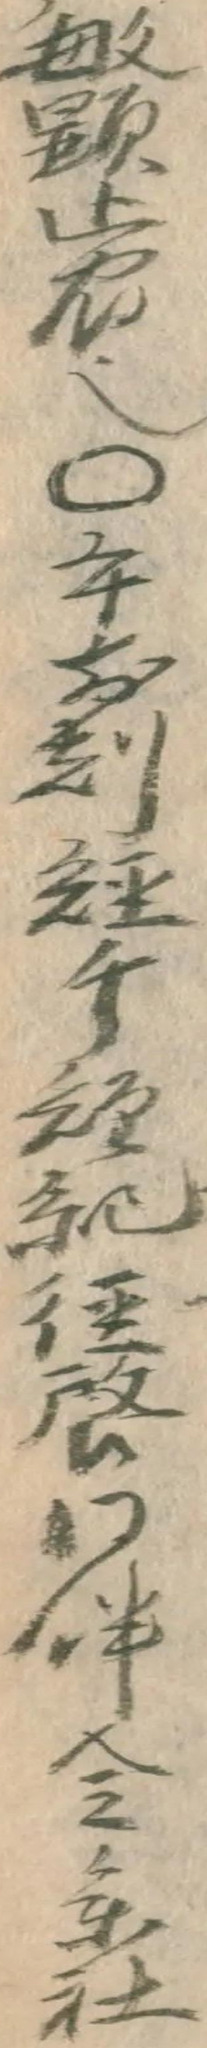敏顕止宿也○午前刻経千経紀経啓同伴令参社

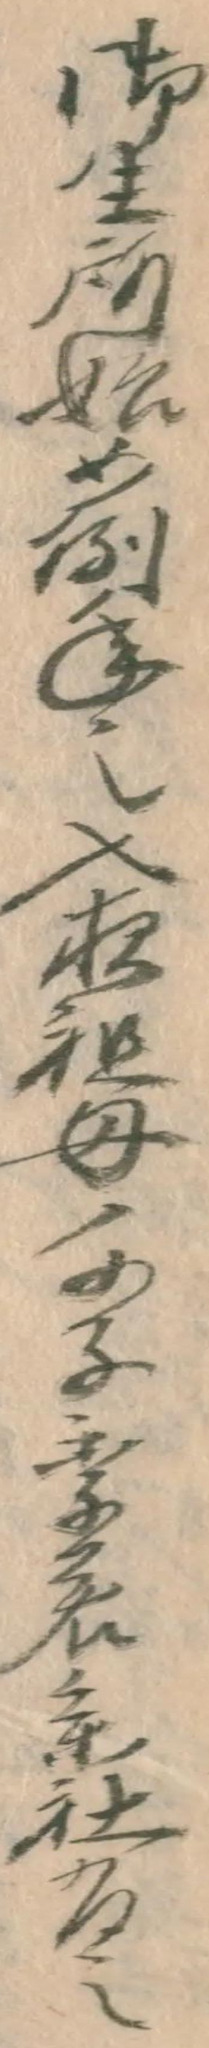御生所始如例年也入夜祖母千子季若参社有之
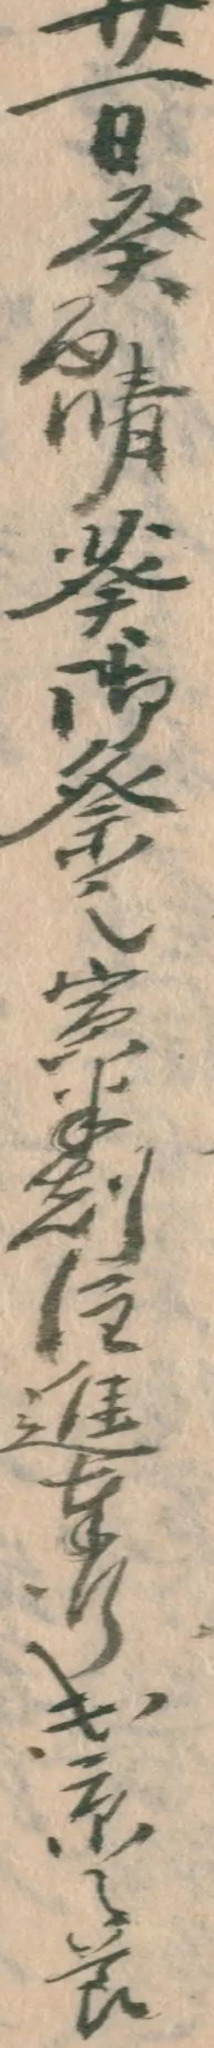廿一日癸酉晴葵御祭也寅半刻注進奉行出京之節
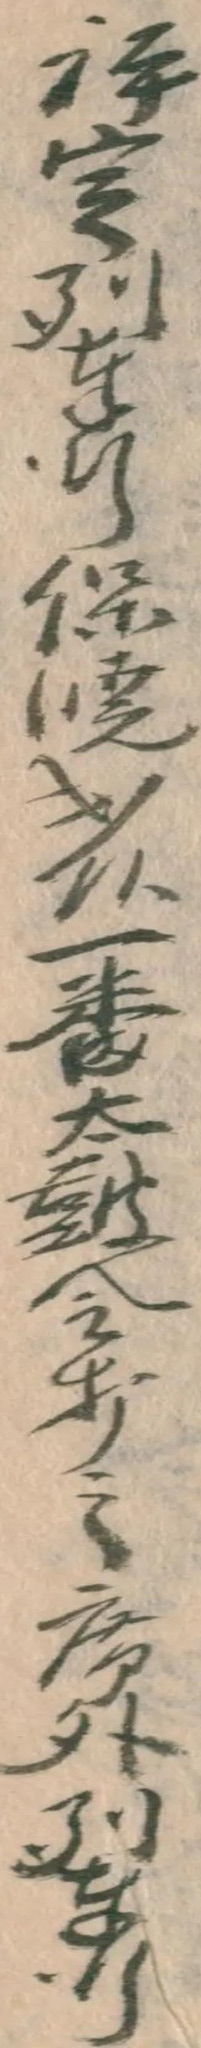評定列奉行保暁出頭一番太皷令打之席外列奉行
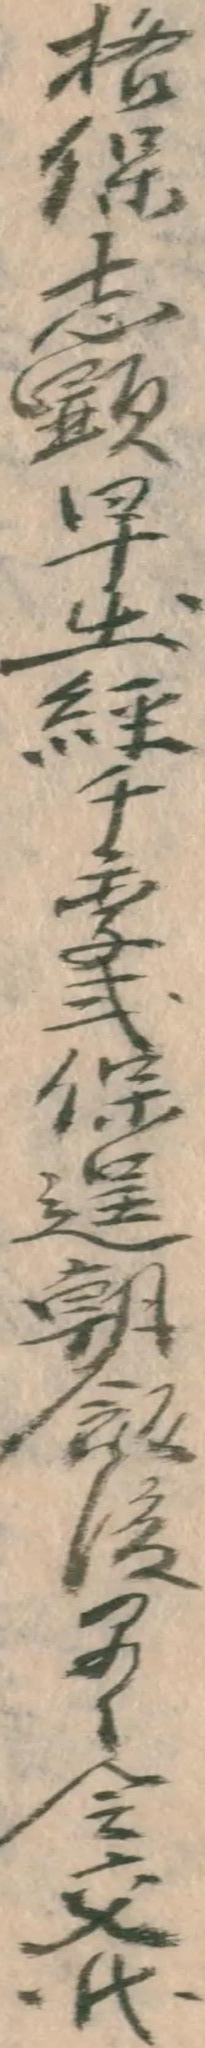格保志顕早出経千季式保逞朝飯後早々令交代
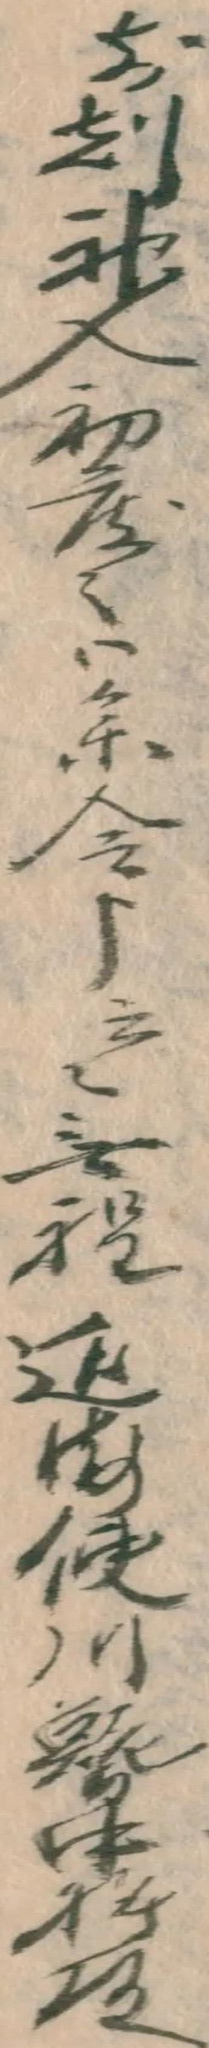前刻神入初度々御参令申云々無程近隣使川鰭中将殿
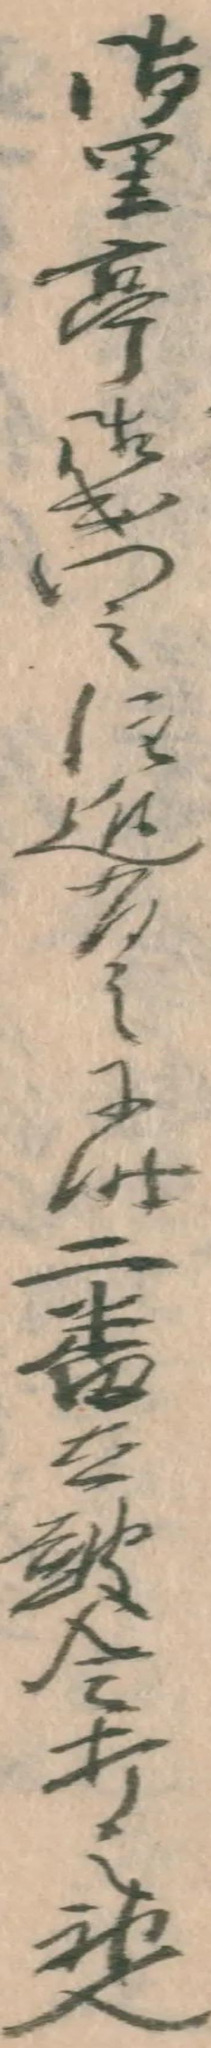御里亭御出門之注進有之于時二番太皷令打之神人
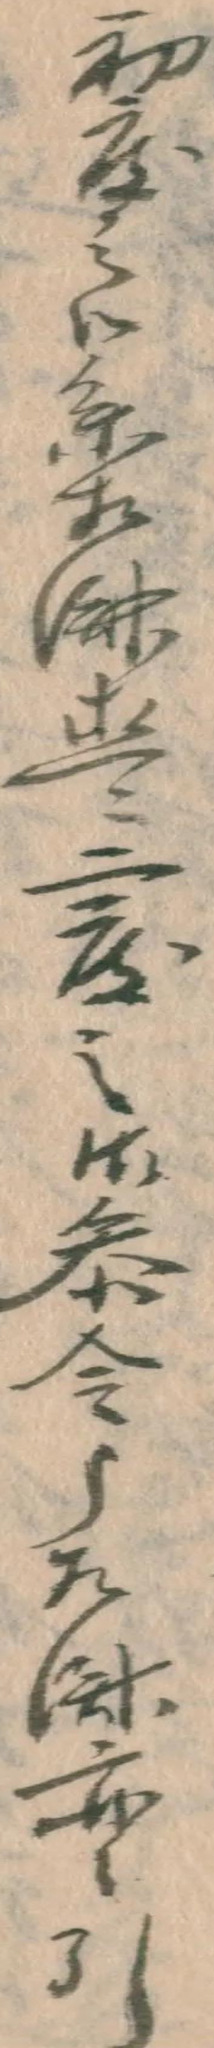初度之御参相済直ニ二度御参令申相済亦々引
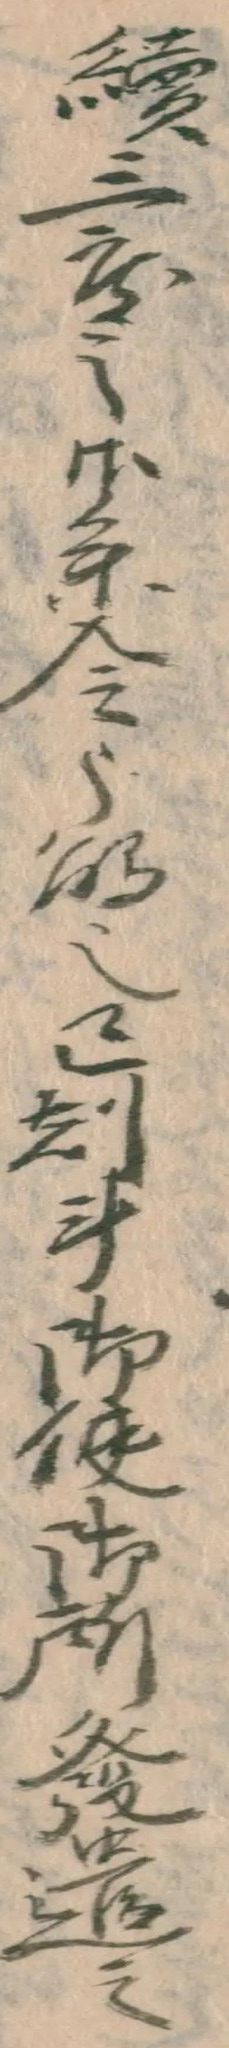續三度之御参令申觸也巳刻斗御使御所発遣之
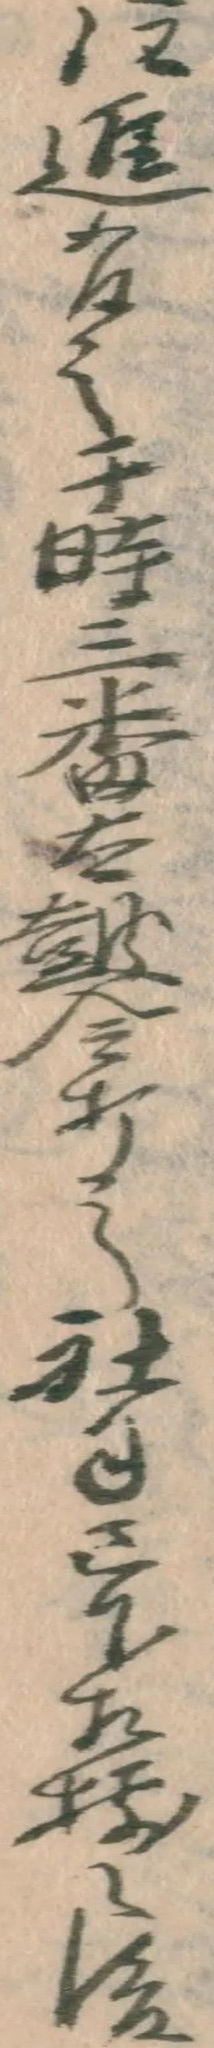注進有之于時三番太皷令打之社司已下相揃之後
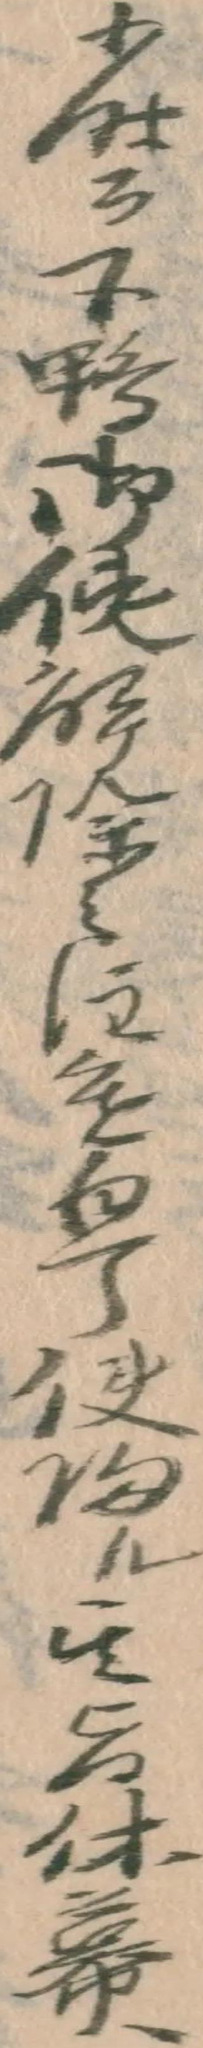小時而下鴨御使解除之注進白丁使帰ル其旨休幕へ
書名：賀茂社記録. 第67冊
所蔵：国立国会図書館 National Diet Library, JAPAN
